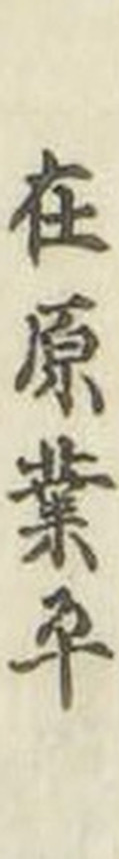在原業平

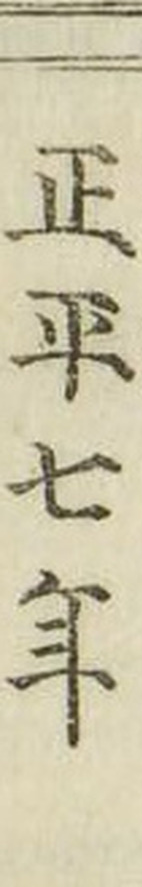正平七年
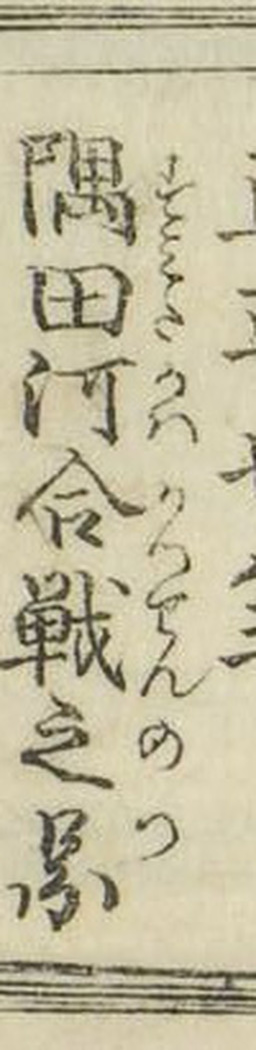隅田川合戦之図

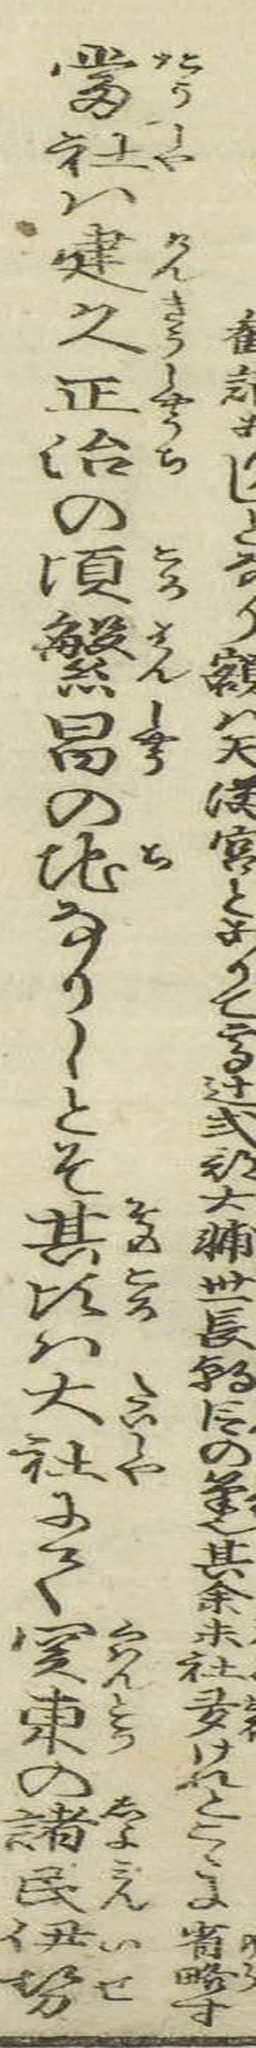当社は建久正治の頃繁昌の地なりしとそ其頃は大社にて関東の諸民伊勢
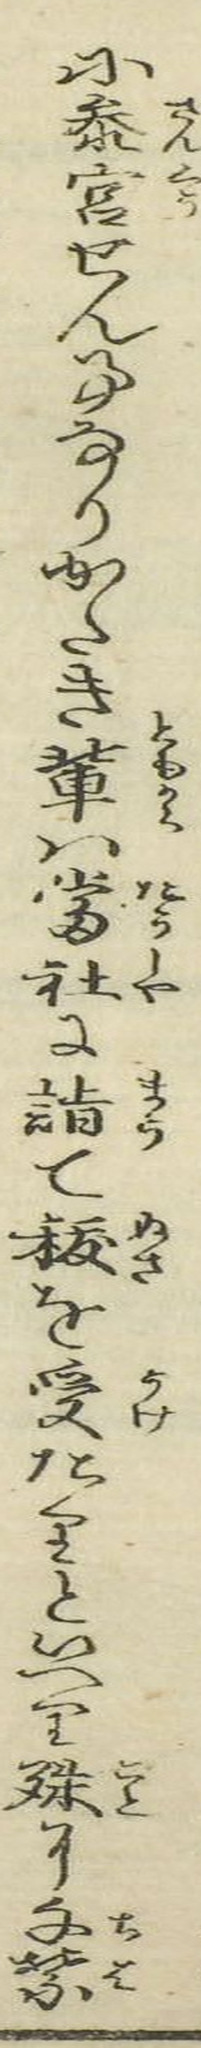に参宮せん事なりかたき輩は当社に詣て祓を受たりといへり殊に千葉
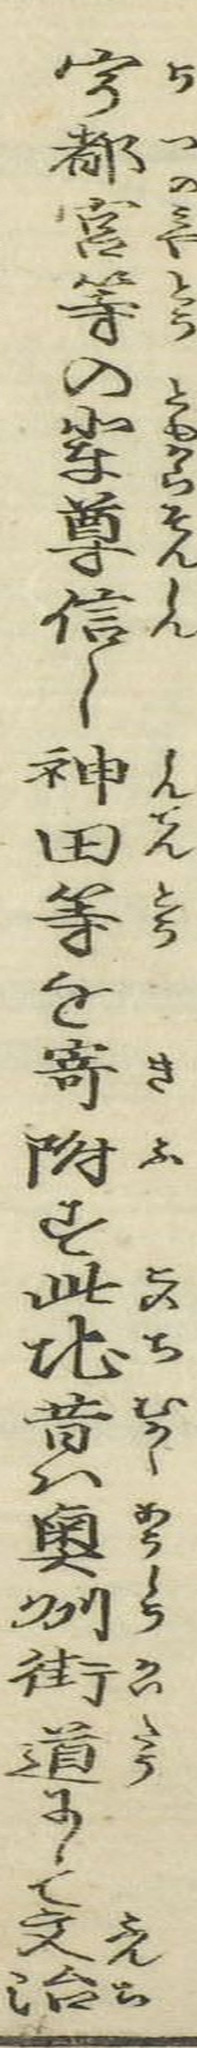宇都宮等の輩尊信し神田等を寄附す此地昔は奥州街道にして文治
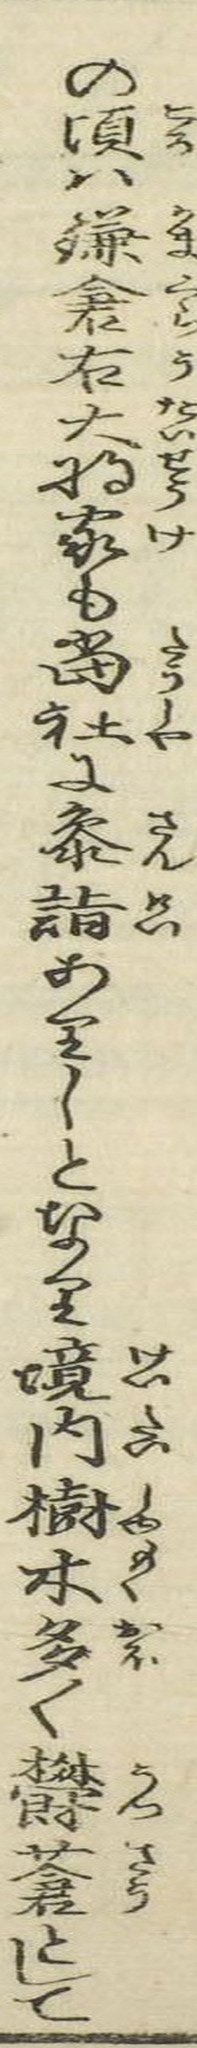の頃は鎌倉右大将家も当社に参詣ありしとなり境内樹木多く鬱蒼として
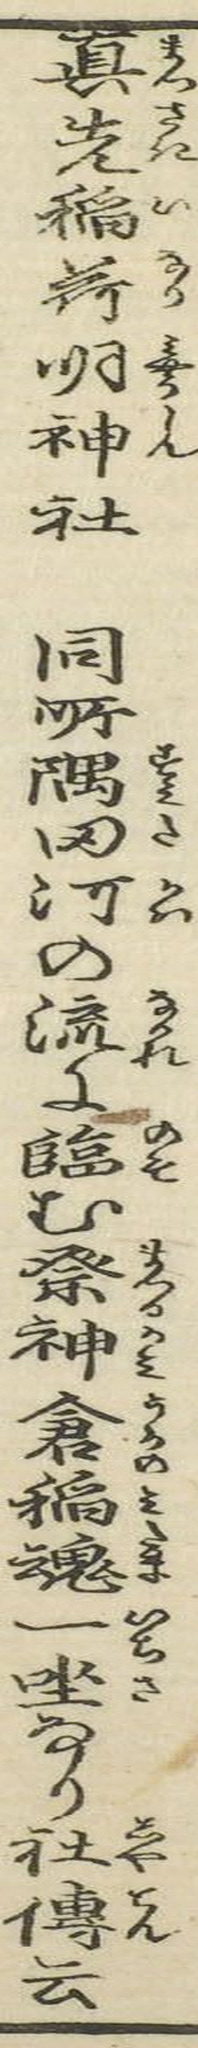真先稲荷明神社同所隅田河の流に臨む祭神倉稲魂一坐なり社伝云
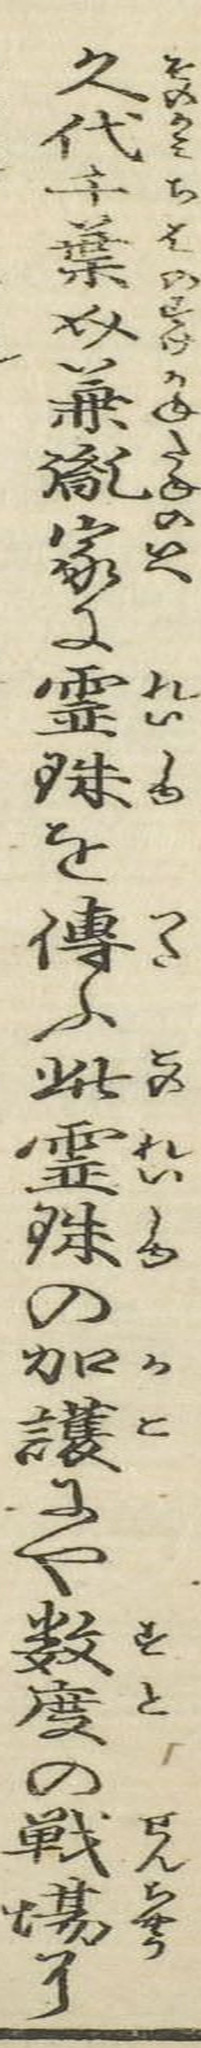久代千葉介兼胤家に霊珠を伝ふ此霊珠の加護にや数度の戦場に
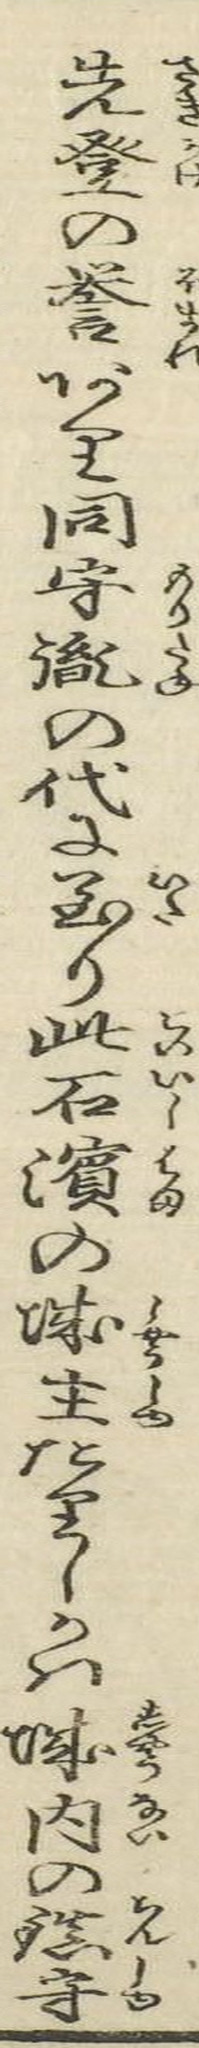先登の誉あり同守胤の代に至り此石浜の城主たりしかは城内の鎮守
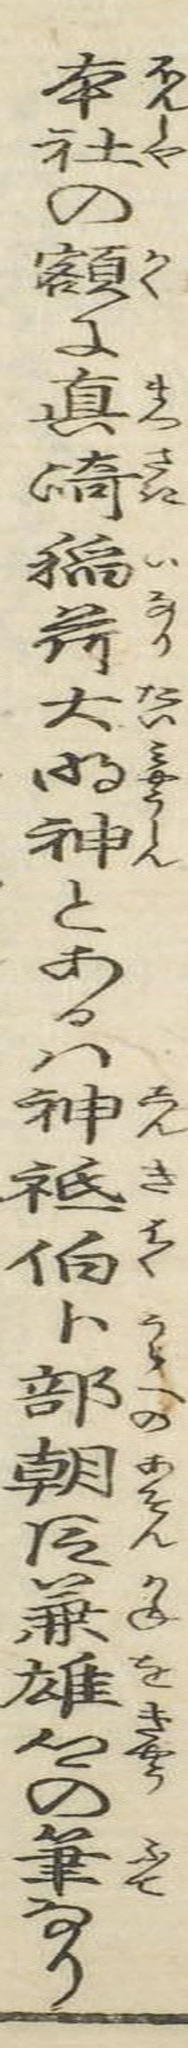本社の額に真崎稲荷大明神とあるは神祇伯卜部朝臣兼雄卿の筆なり
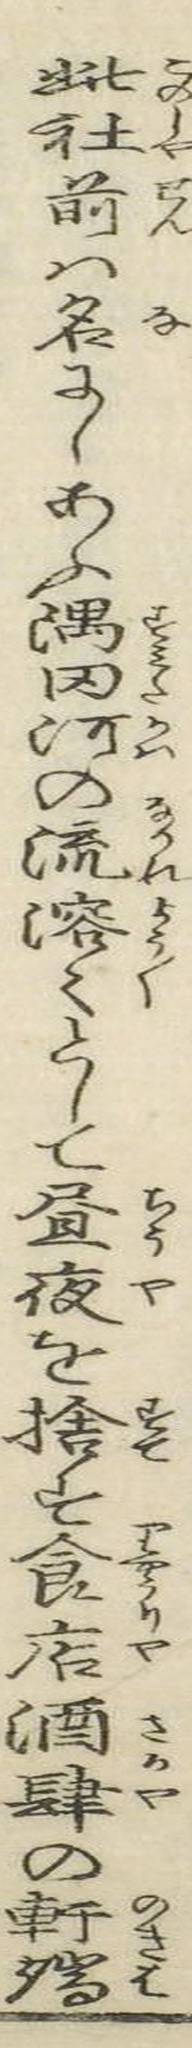此社前は名にしあふ隅田河の流溶々として昼夜を捨す食店酒肆の軒端
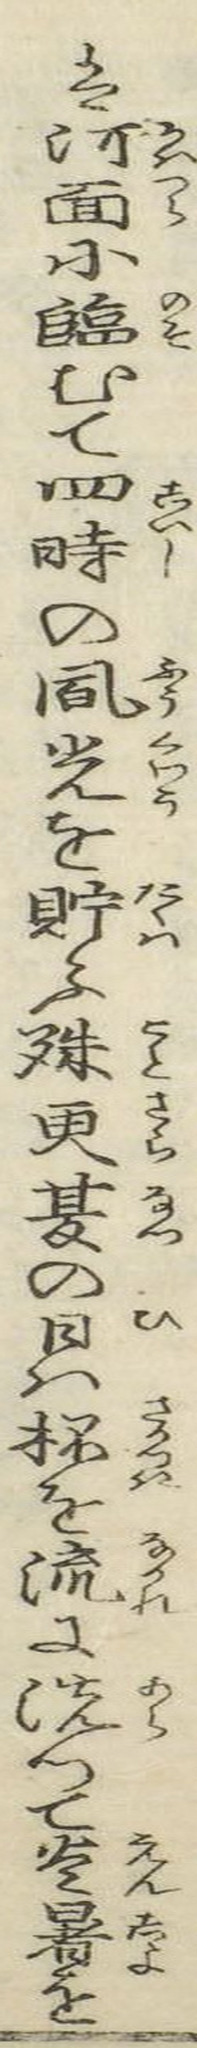は河面に臨むて四時の風光を貯ふ殊更夏の日は杯を流に洗つて炎暑を
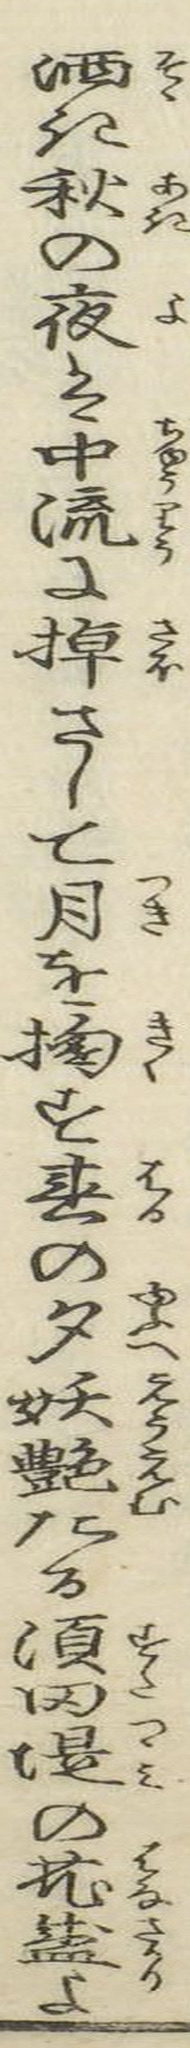洒き秋の夜は中流に棹さして月を掬す春の夕妖艶たる須田堤の花盛よ
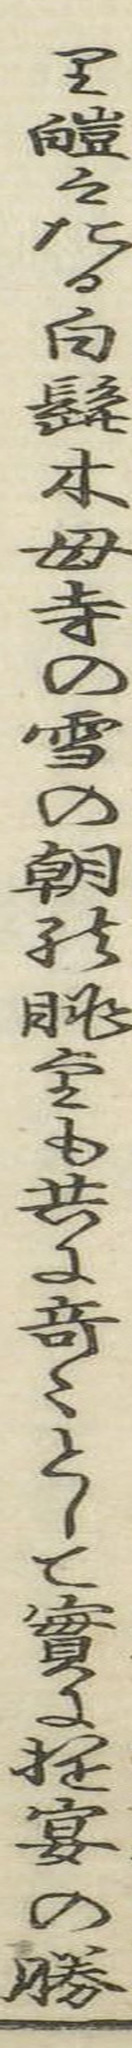り皚々たる白髭木母寺の雪の朝の眺望も共に奇々として実に遊宴の勝
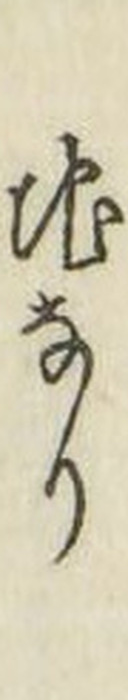地なり
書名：江戸名所図会 20巻 巻之17
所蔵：東京学芸大学教育コンテンツアーカイブ
